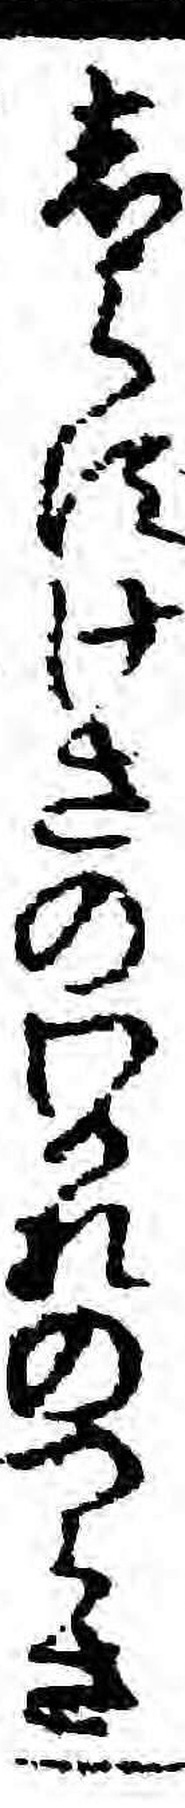しらずけさのわかれのつらさ
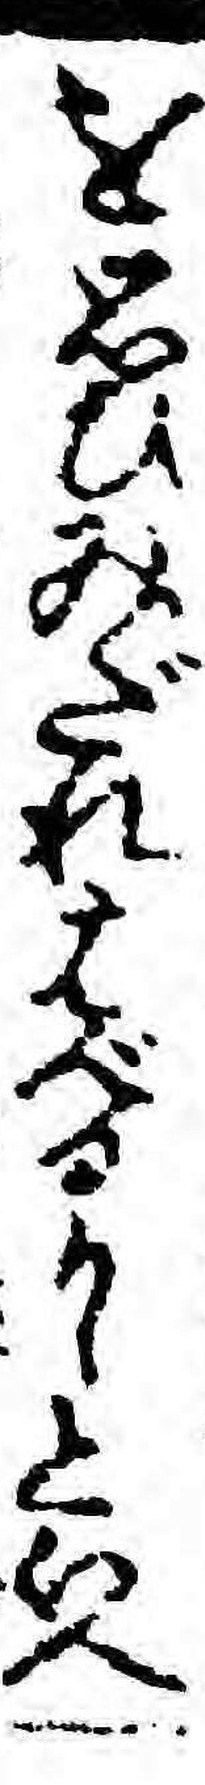を思ひみだれはべるかしといへ
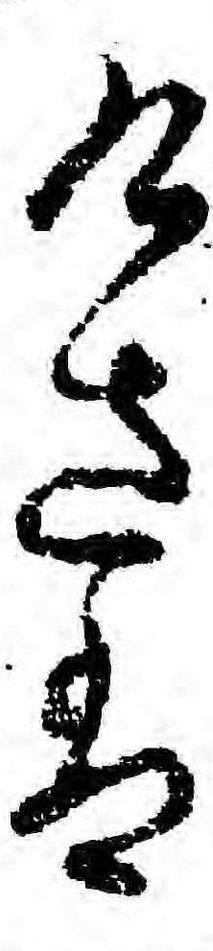けさは
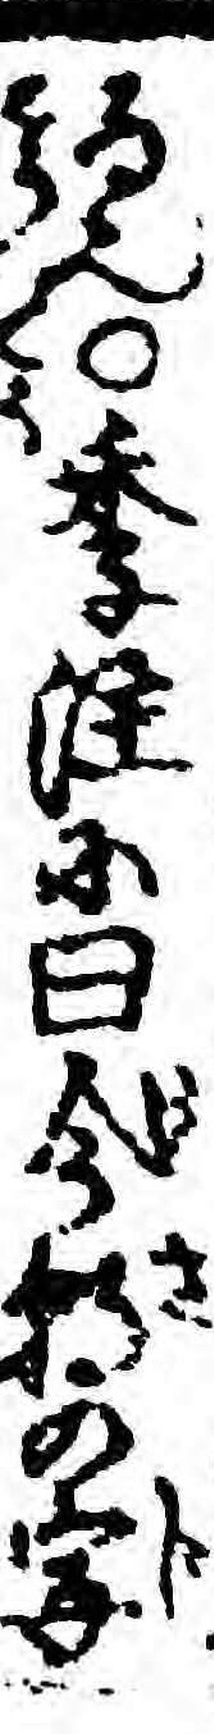る也〇季注に曰今朝の字
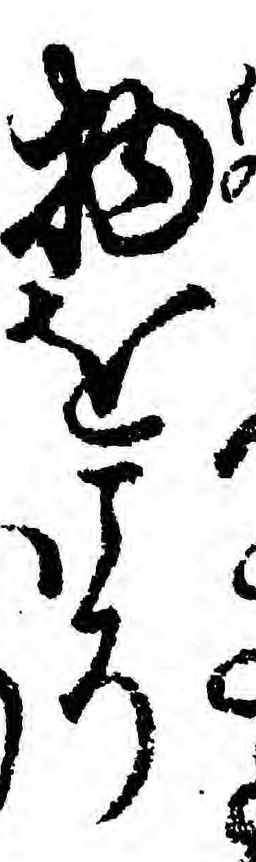物をこそ
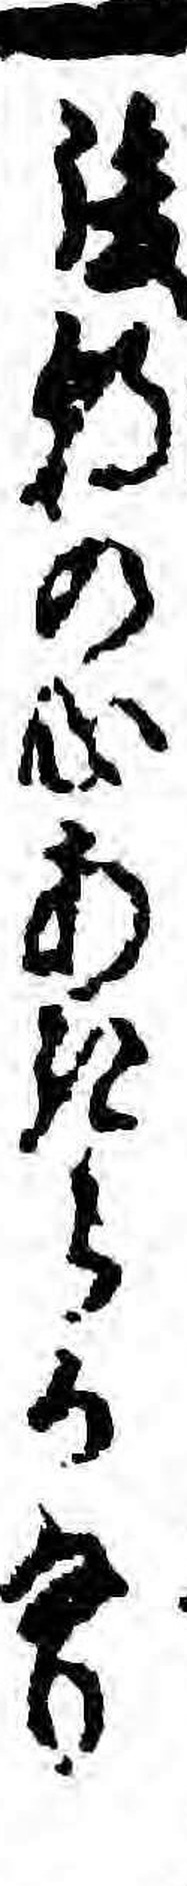後朝の心あきらかなり
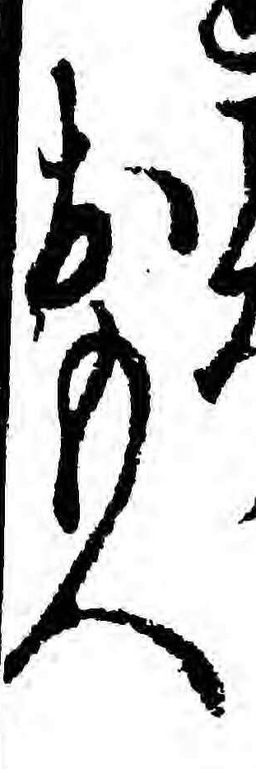おもへ
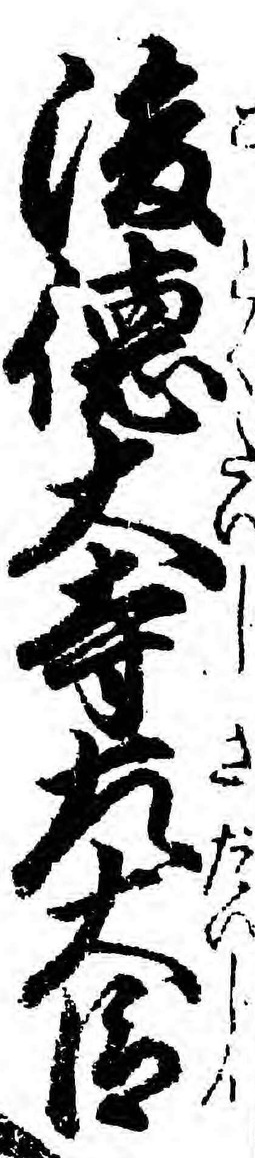後徳大寺左大臣
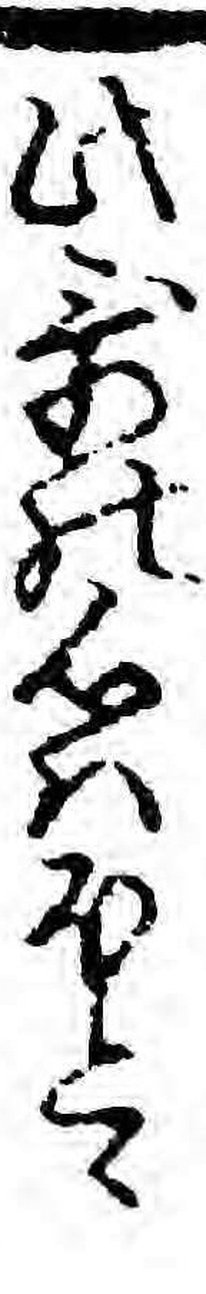此哥の心はほとゝ
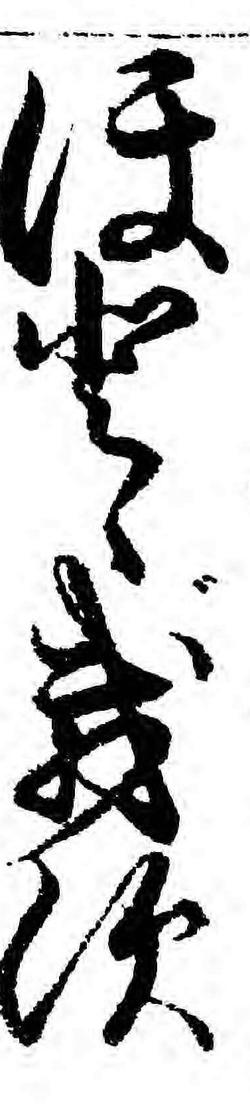ほとゝぎす
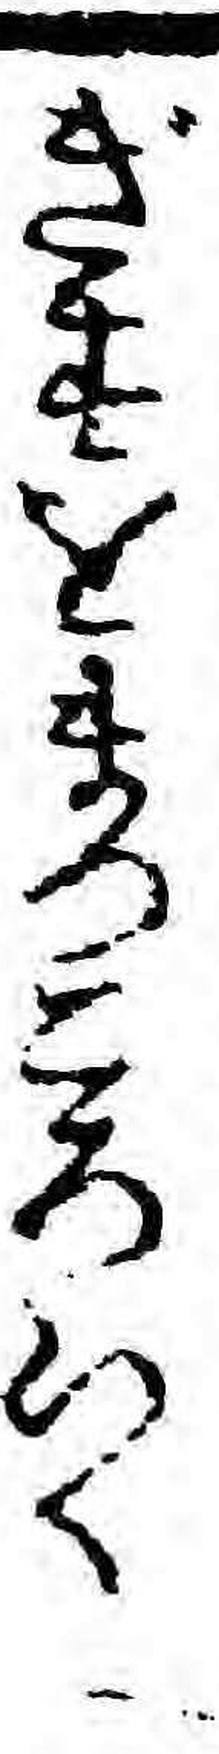ぎすをまつころいく
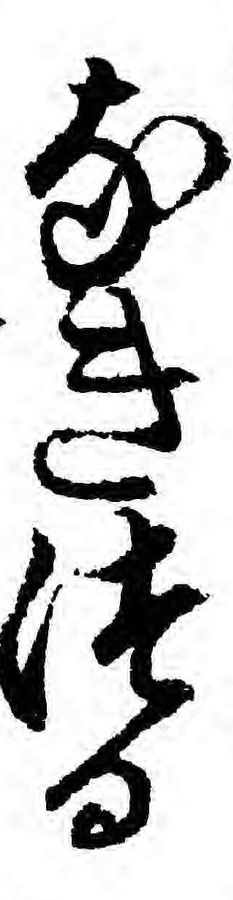なきつる
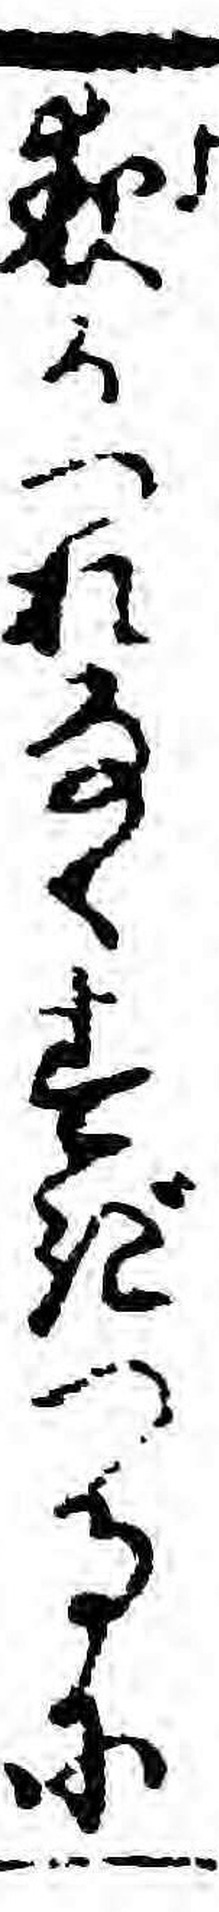夜かつれなくすぎつるに
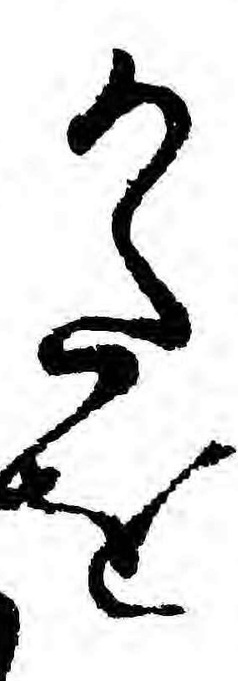かたを
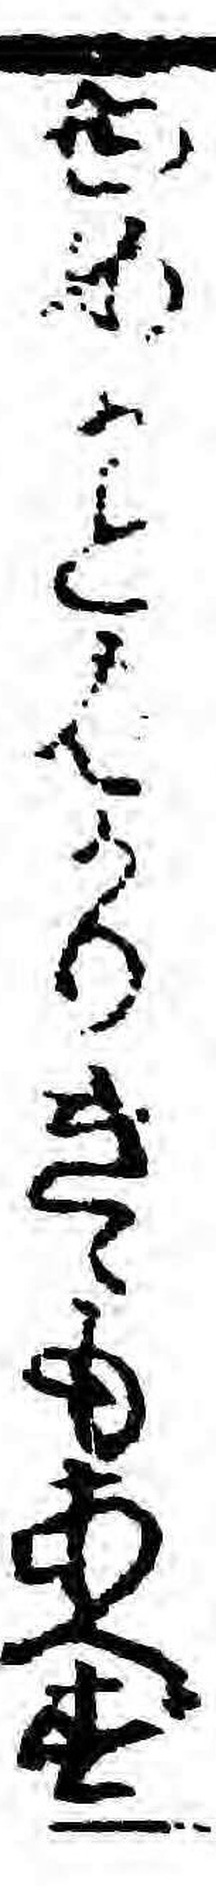ゆめかとばかりきゝもあへず
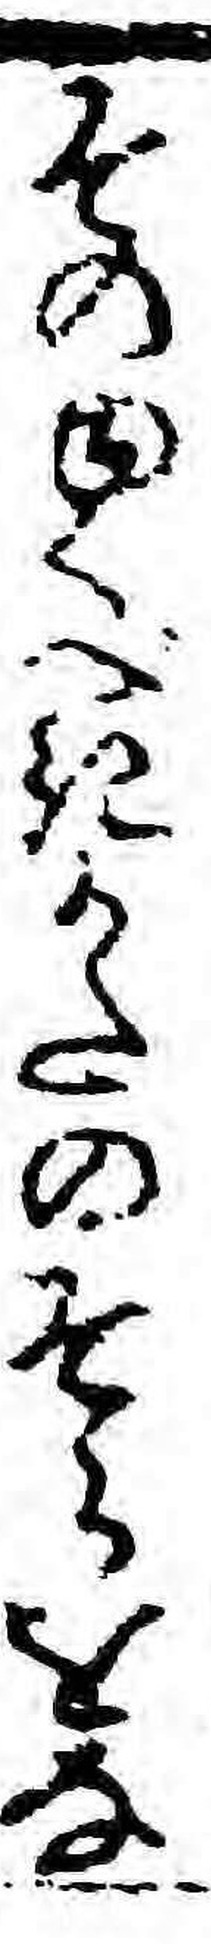そのゆくべきかたのそらをな
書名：頭書和歌注譯／壽賀多百人一首小倉錦
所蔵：国文学研究資料館
